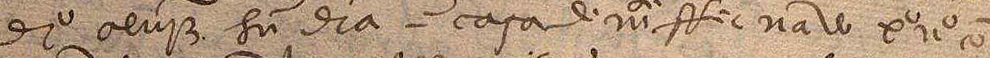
djo alur̄z hū dia ē casa de mte ffernādo xo no cō
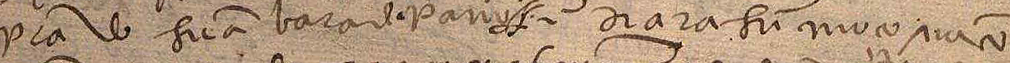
prādo huā vara de panos//. ētrara hū moço seu c̄o
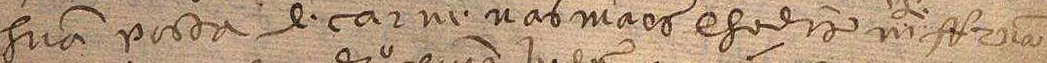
huā posta de carne nas mãos e ho dito mte ffernā
